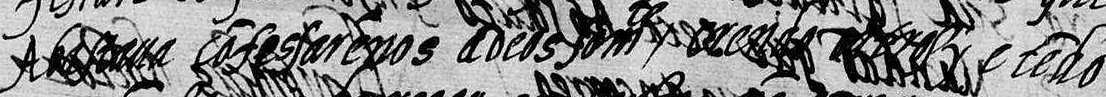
A bastaua cōfessarēnos a deos somte crendo outrosy e tēdo
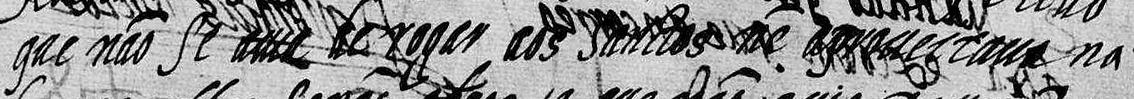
que não se auia de rogar aos Sanctos nē aproueitaua na
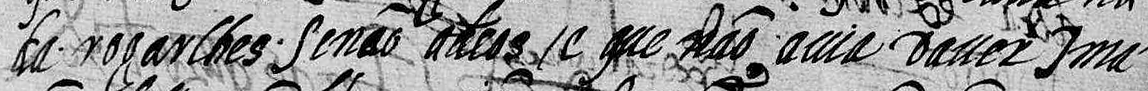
da rogarlhes senão a deos / e que não auia dauer Jma
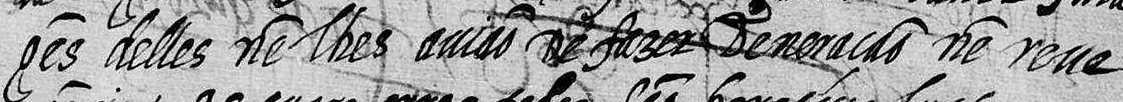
gēs delles nē lhes auiaõ de fazer Veneraçaõ nē reue
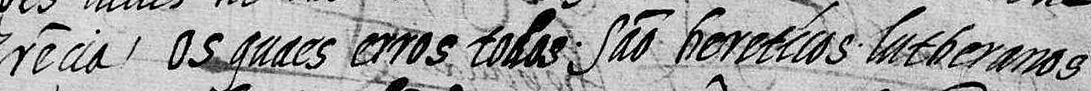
rēcia / os quaes erros todos são hereticos lutheranos
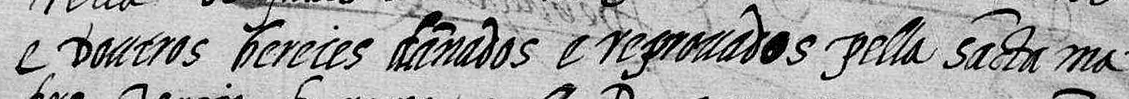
e Doutros hereies dānados e reprouados pella sa̅cta ma
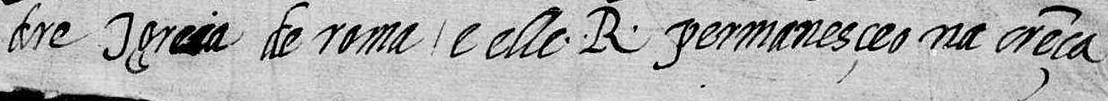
dre Jgreia de roma / e elle .R. permanesceo na crēça
